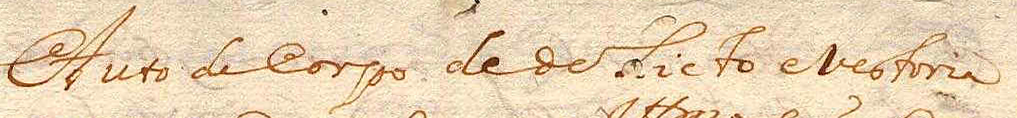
Auto de corpo de delicto e vestoria
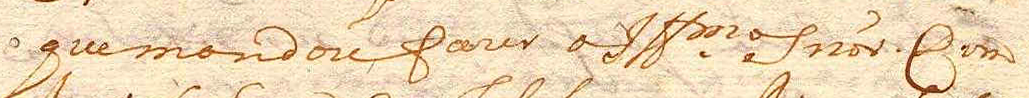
que mandou fazer o Ill.mo Snor̄. Dom
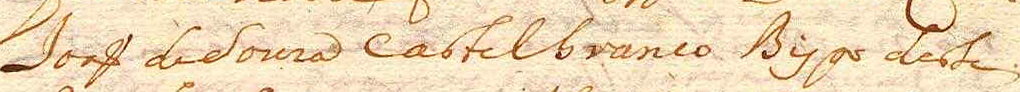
Joaõ de Souza Castel branco Bispo deste
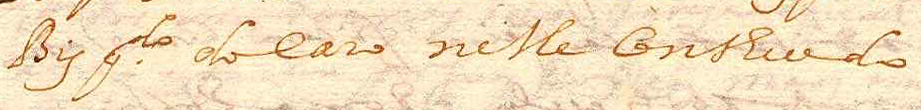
Bisp.do do cazo nelle contheudo
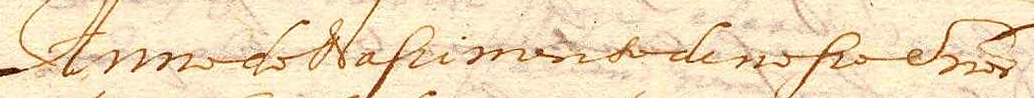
Anno do Nascimento de nosso Snōr
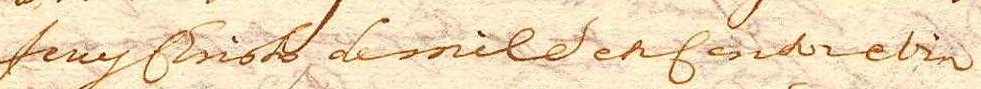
Jezus Christo de mil SeteCentos e vin
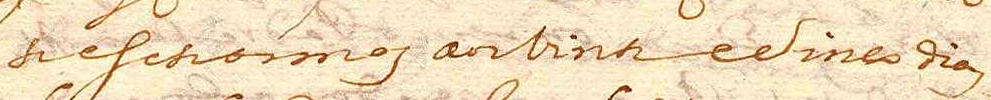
te e sete annos aos vinte e sinco dias
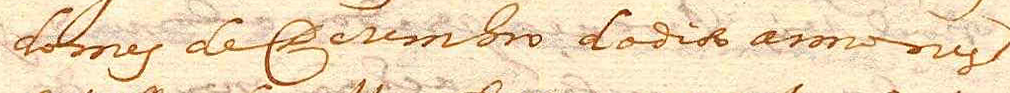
do mes de Dezembro do dito anno nes
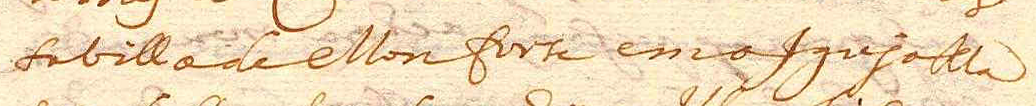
ta villa de Monforte em a Jgreja Ma
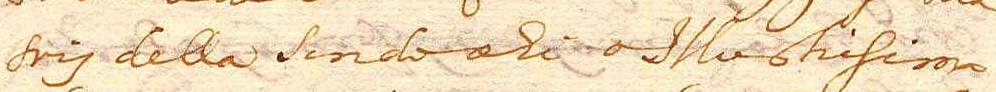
triz della sendo ahi o Illustrisimo
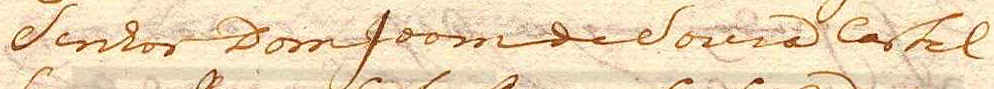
Senhor Dom Joam de Souza castel
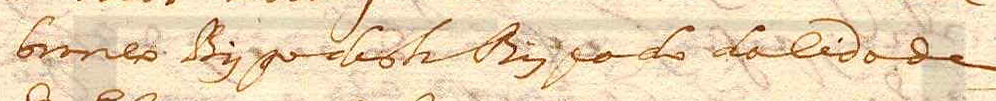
branco Bispo deste Bispado da cidade
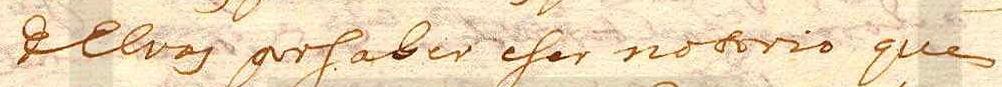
d̄ Elvas por saber e ser notorio que
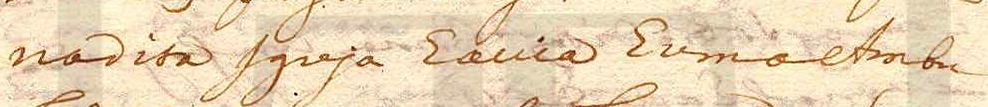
na dita Jgreja hauia huma Ambu
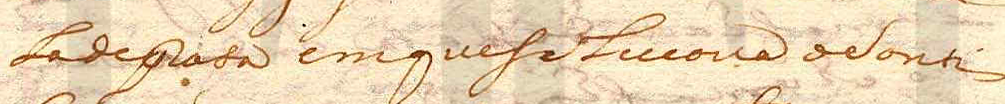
La de prata em que se Leuaua o Santi
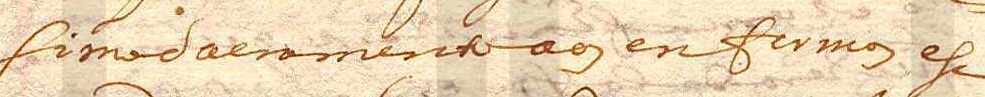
simo Sacramento aos enfermos e se
